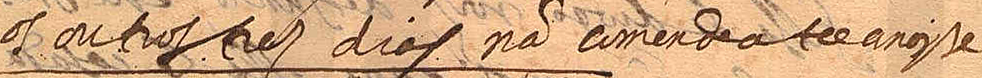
os outros trez dias nā comendo atee a noyte
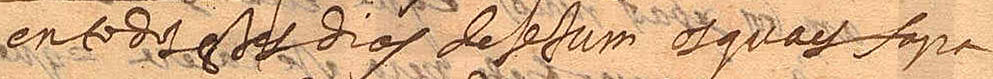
em todos estes dias de Jejum os quaes fazia
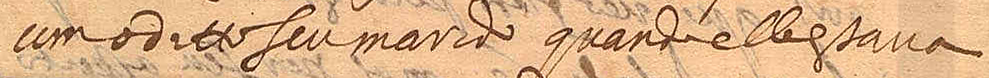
com o ditto seu marido quando ellestava
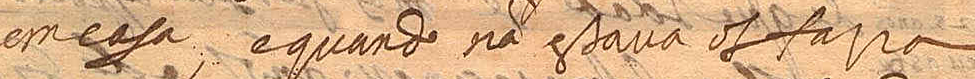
em casa, e quando nā estava os fazia
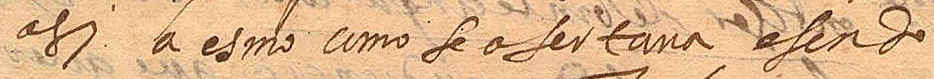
asj a esmo como se asertava e sendo
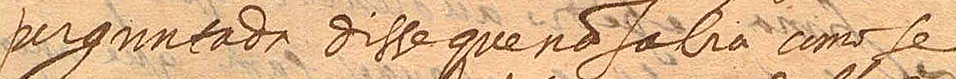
perguntada disse que nā sabia como se
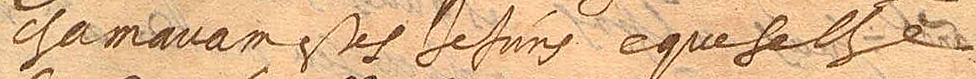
chamavamstes jejuns e que se lhe
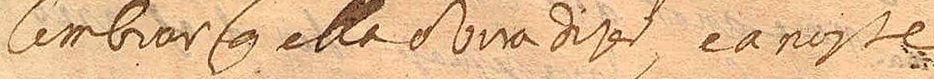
lembrar q̄ ella o vira dizer, e a nojte
